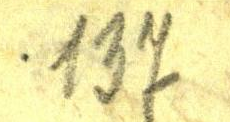137
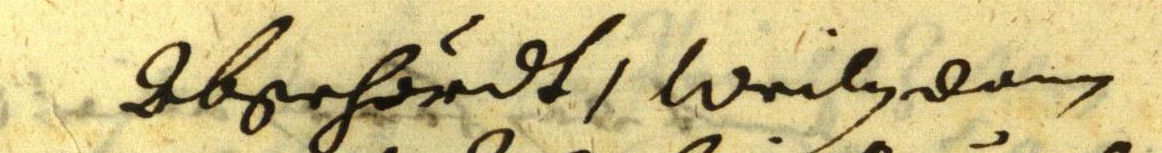Abgehōrdt, Weiln dann
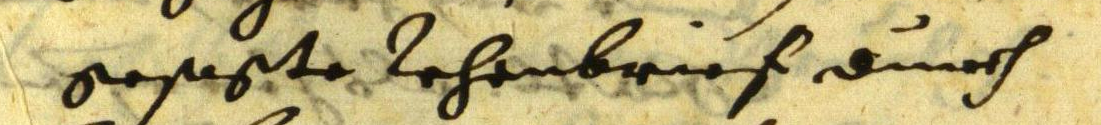gesagte Lehenbrief dūrch
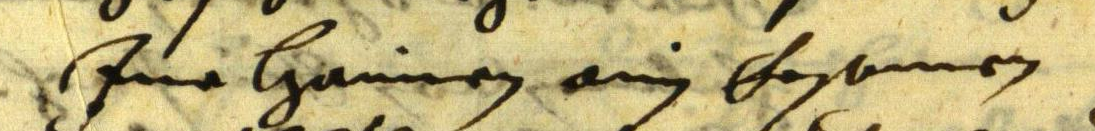Ime Haimen aim Ersamen
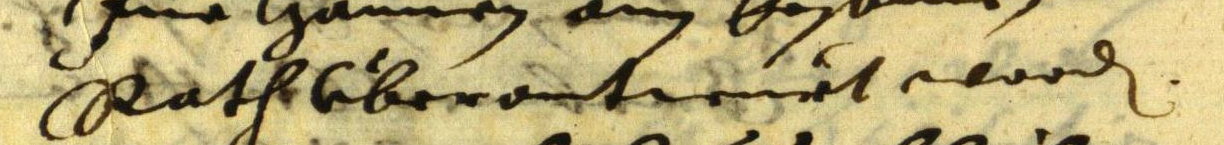Rath v̄berantwūrt werd.
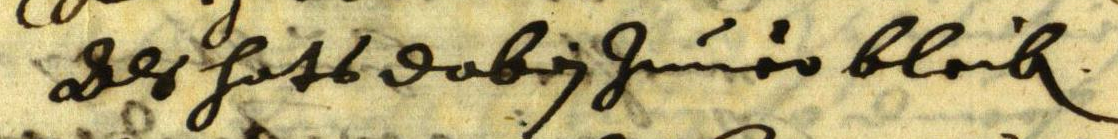Als hats dabej Zūūerbleib.
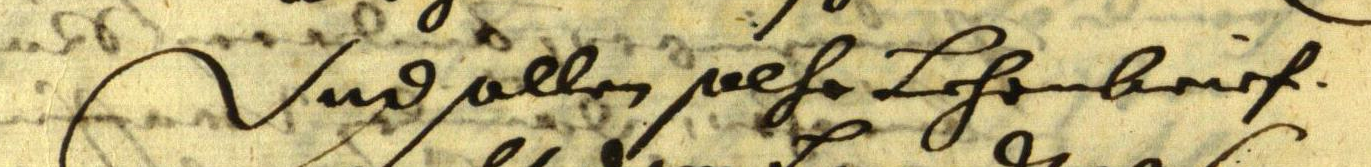Vnd sollen solhe Lehenbrief.
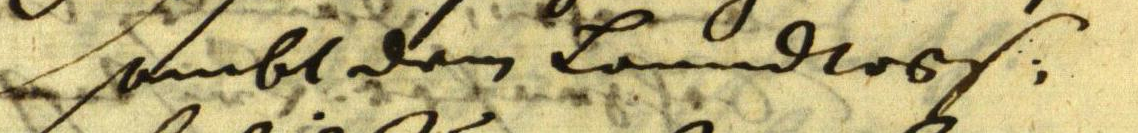sambt den Lanndtags¬
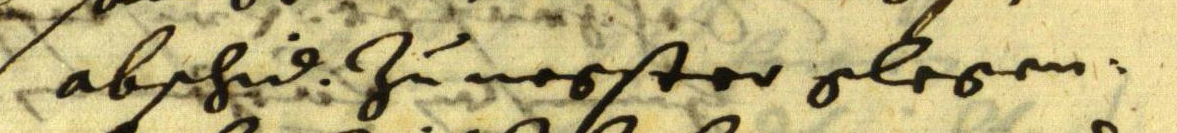abschid. Zū negster glegen¬
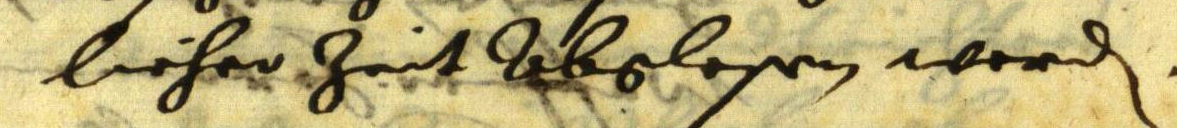licher Zeit Abglesen werd.
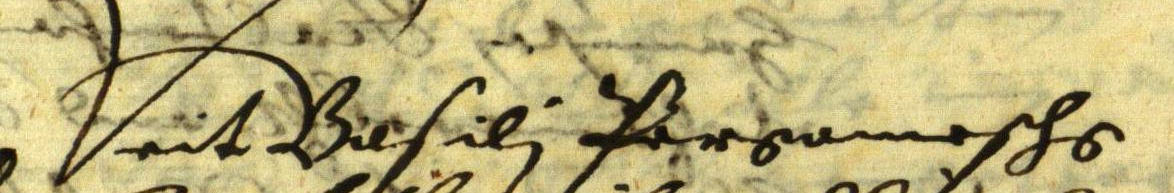Veit Basilj Pergameschg
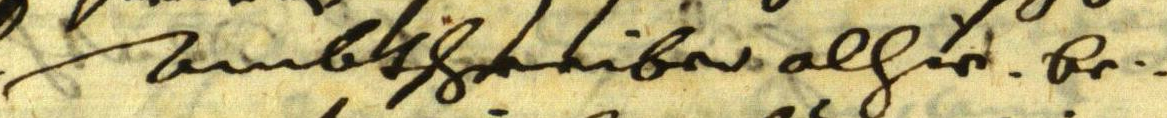Ambtschreiber alhie. be¬
